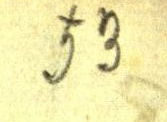53
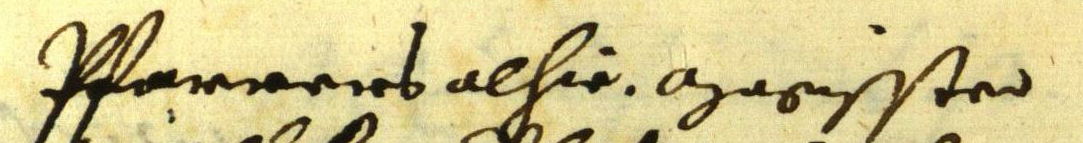Pfarrers alhie. Magisster
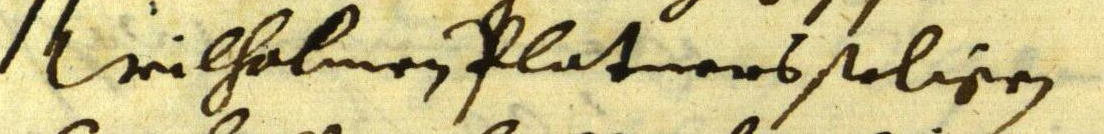Wilhalmen Platners seligen
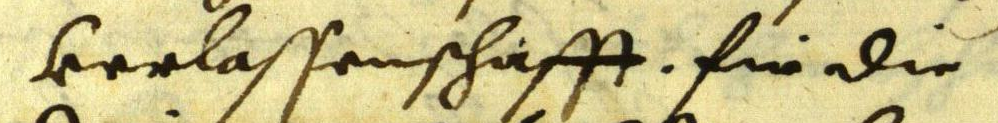verlassenschafft. fir die
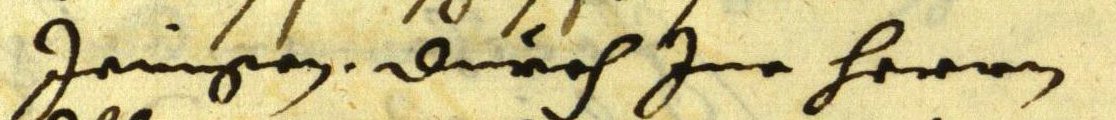Jenigen. dūrch Ine herrn
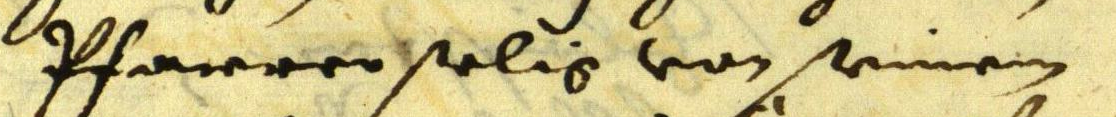Pfarrer selig von seinem
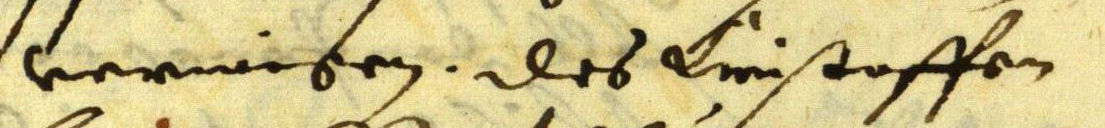vermigen. des Cristoffen
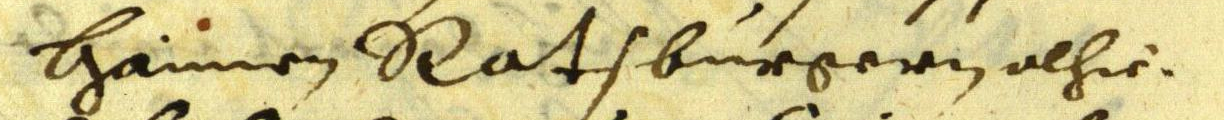Haimen Ratsbūrgern alhie
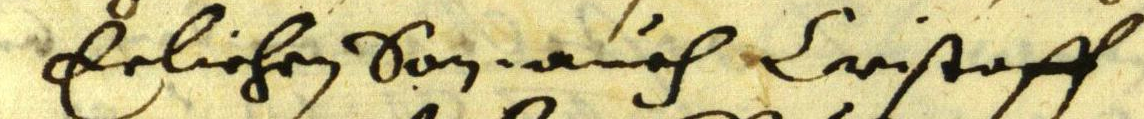Eelichen Son. aūch Cristoff
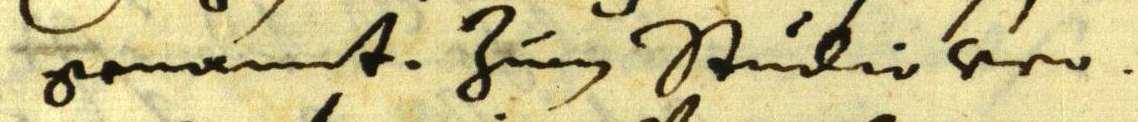genannt. Zūm Stūdir ver¬
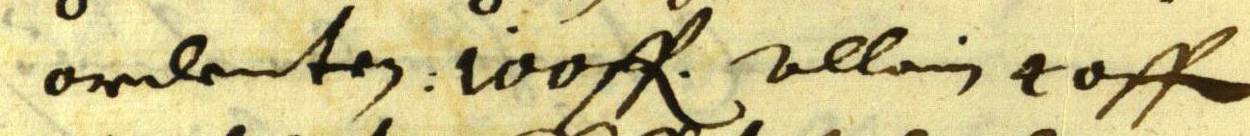ordneten: 100 fl. Allain 40 fl
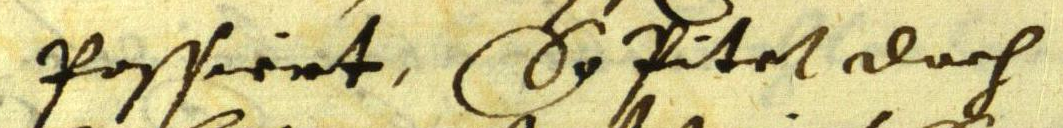Possiert, So pitet doch
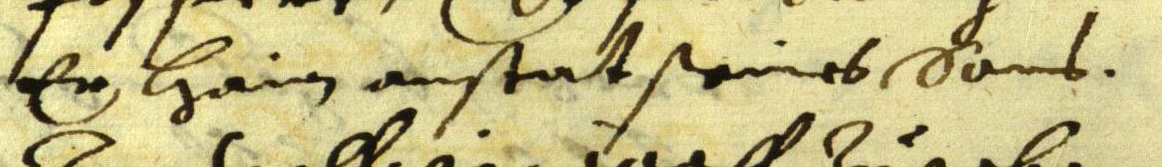Er Haim anstat seines Sons.
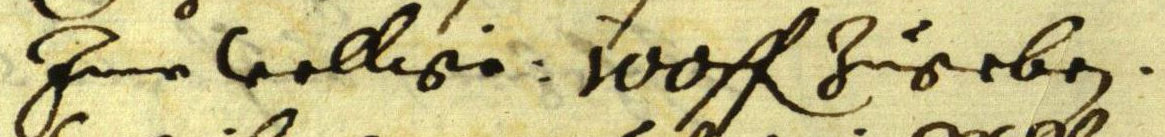Ime vellige: 100 fl Zūgeben.
